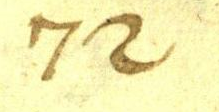72
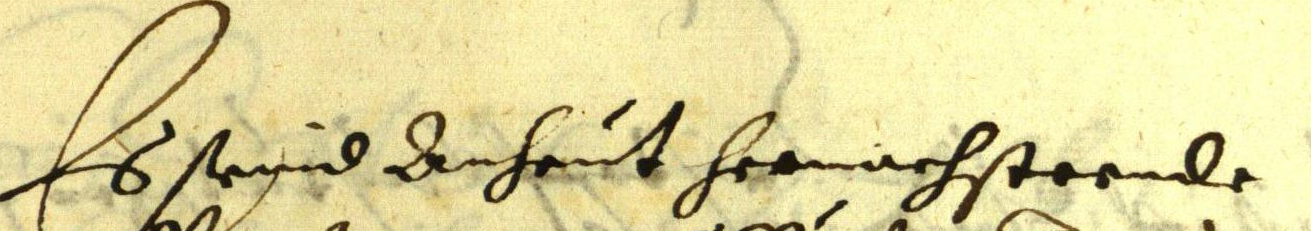Es seind Anheūt hernachsteende
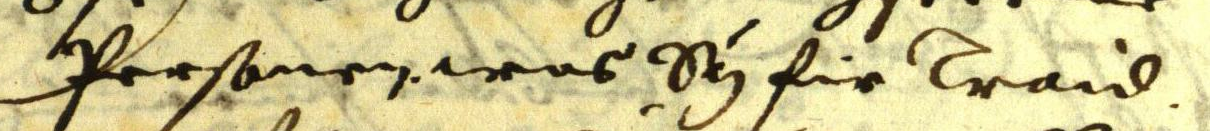Personen. was Sȳ fir Traid.
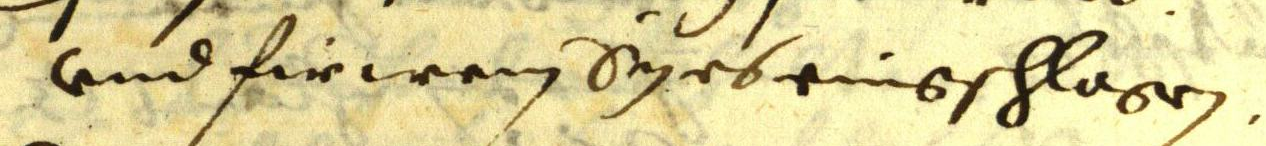vnd fir wem Sȳ es eingschlagen.
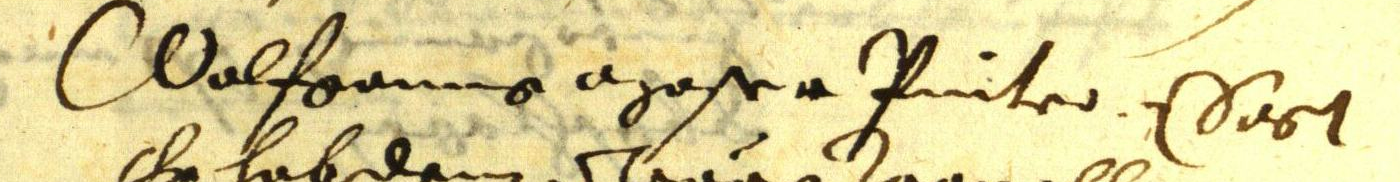Wolfganng Moser Pinter. Sagt
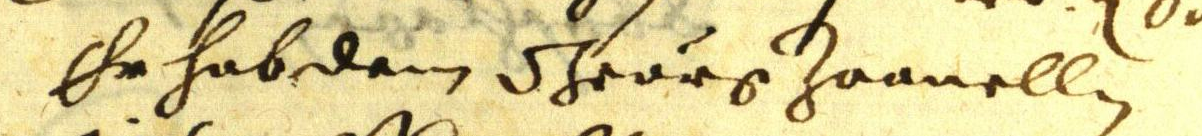Er hab dem Geōrg Zoanelln
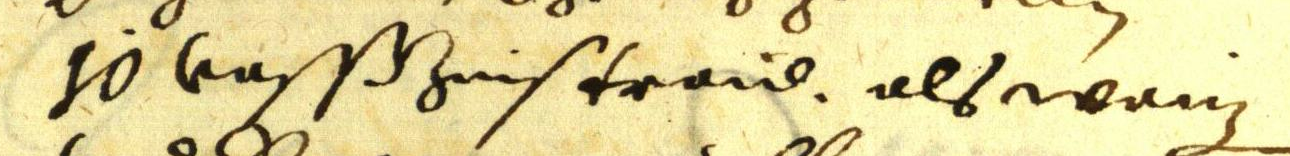10 vasß Zins traid. als Waiz
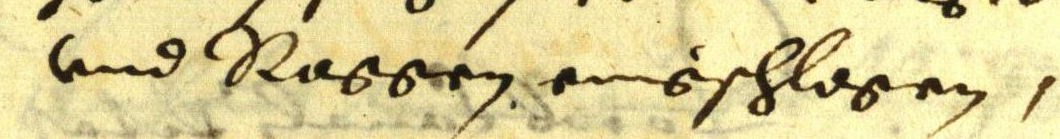vnd Roggen eingschlagen,
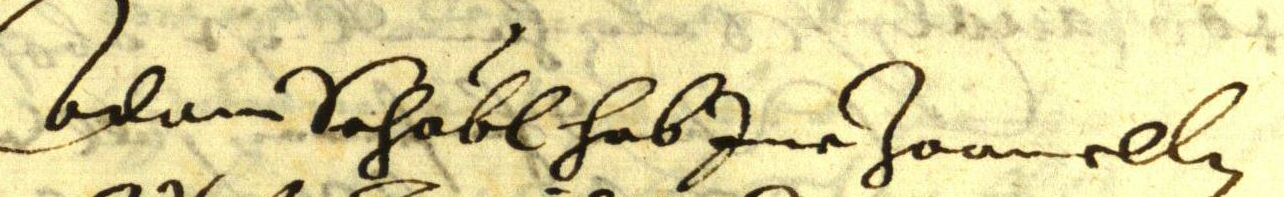Adam Schābl hab Ime Zoanelln
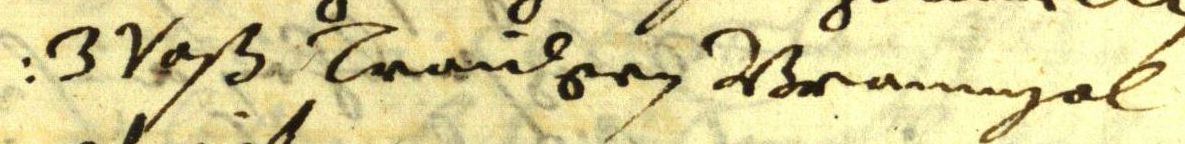:3 Vaß Traid gen Brannzol
